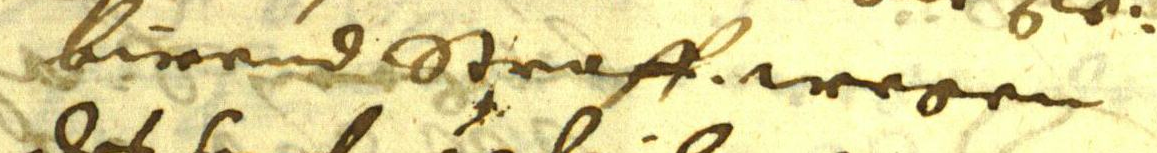birend Straff. wegen
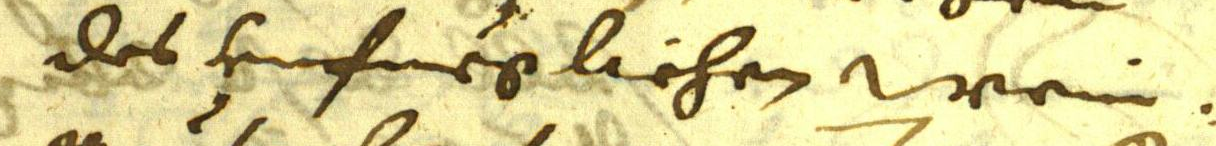des vnfūeg lichen Wein¬
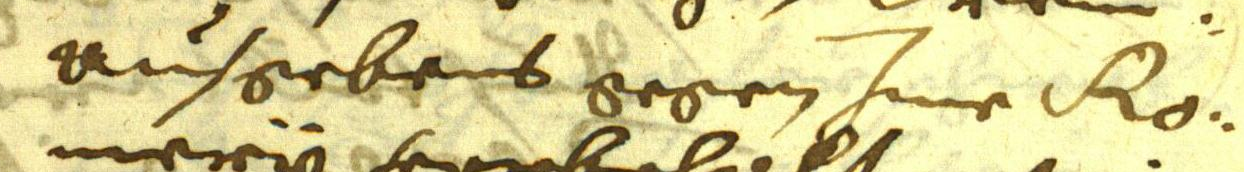Aūsgebens gegen Ime Ro¬
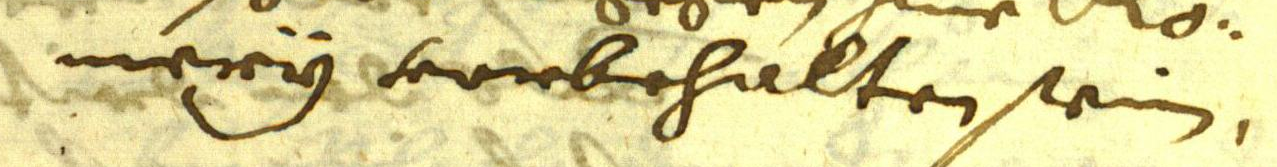merÿ vorbehalten sein,
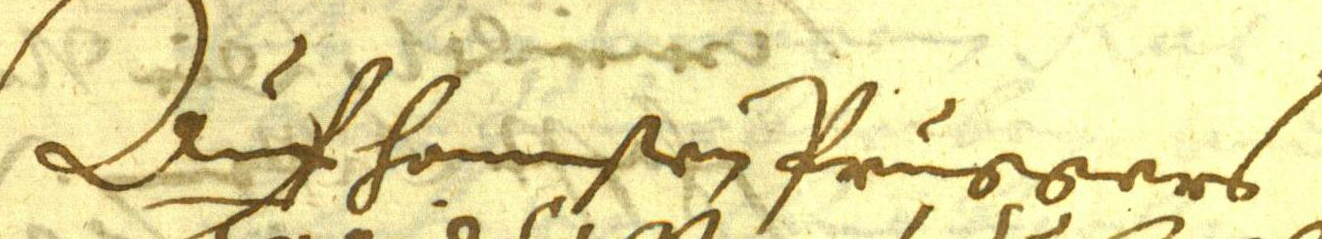Aūf hannsen Prūggers
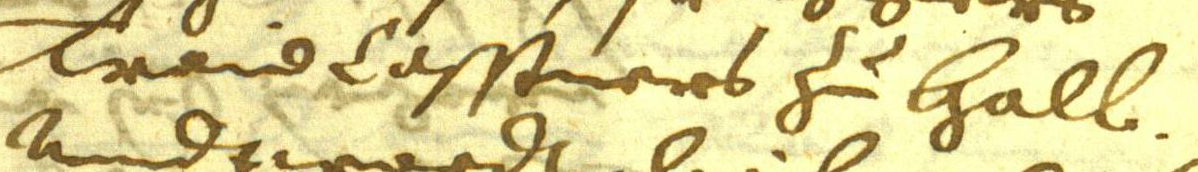Traid Casstners Zū Hall.
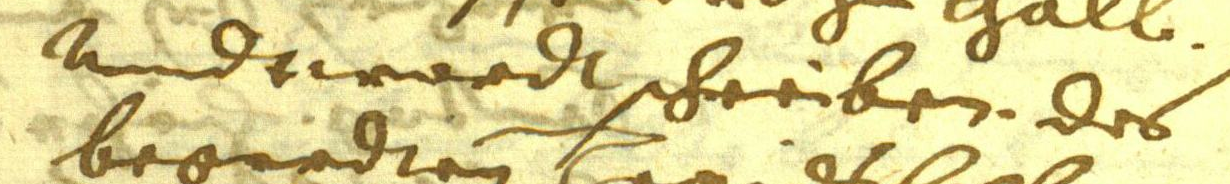Anndtwordt schreiben. des
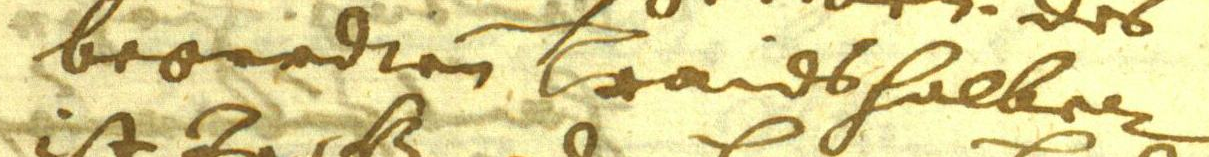begerdten Traids halber
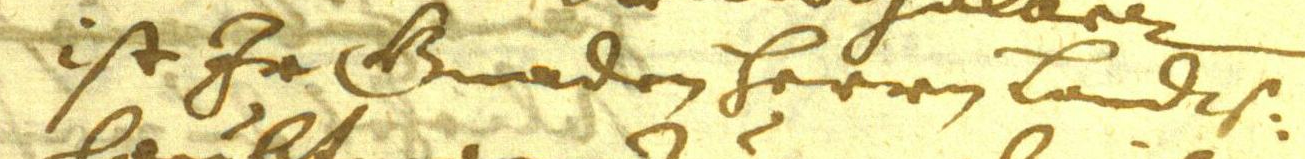ist Ir Gnaden herrn Landts¬
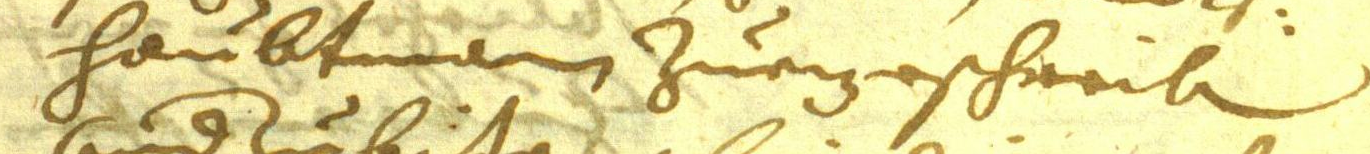haūbtman Zūezeschreib
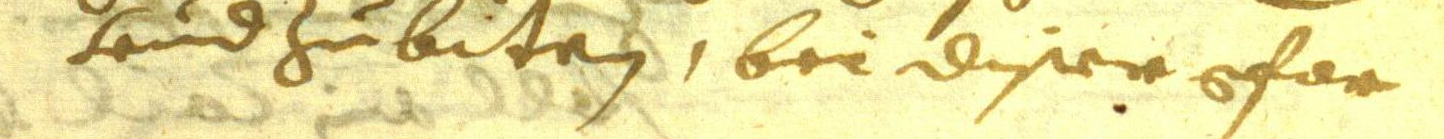vnnd Zū biten, bei diser gfar
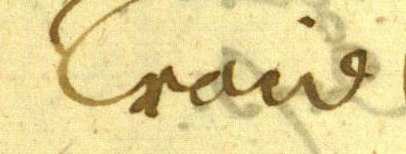Traid
